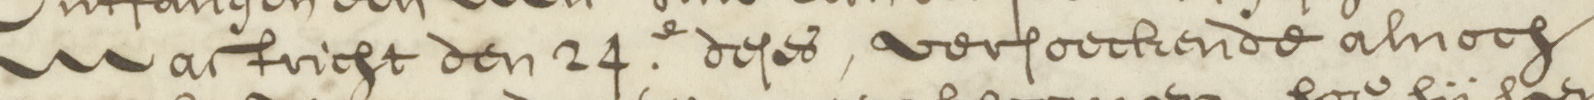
Mastricht den 24.e deses, versoeckende alnoch
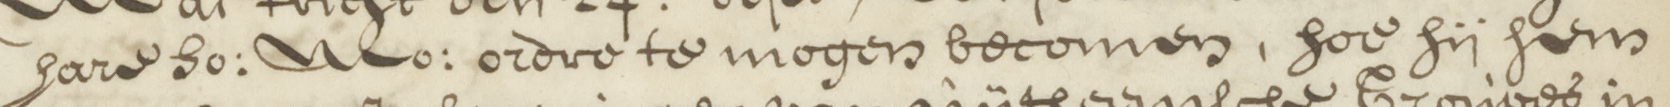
hare ho:Mo: ordre te mogen becomen, hoe hij hem
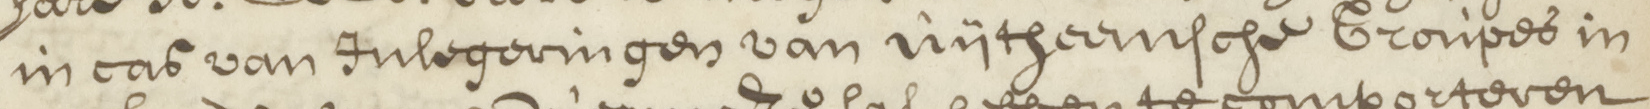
in cas van Inlegeringen van uijtheemsche Troupes in
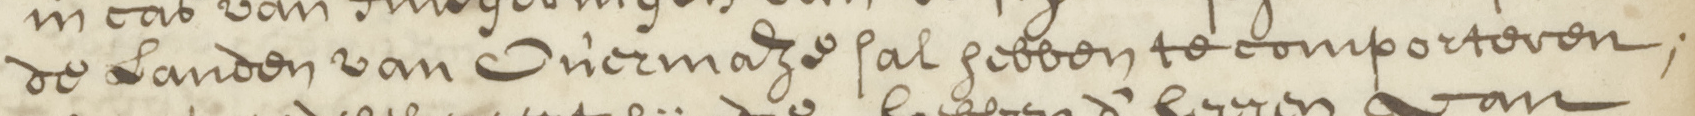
de Landen van Ouermaze sal hebben te comporteren;
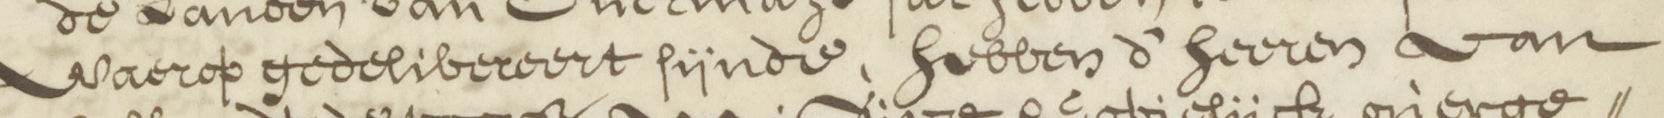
Waerop gedelibereert sijnde, hebben d'heeren van
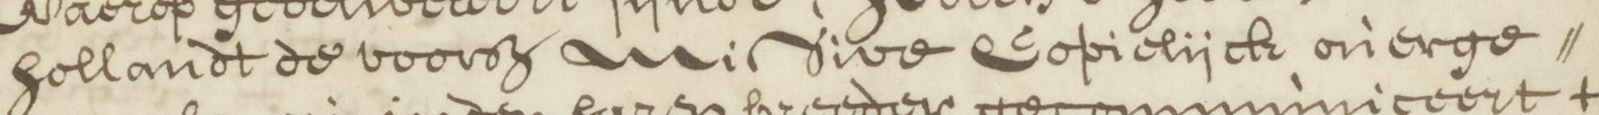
hollandt de voorsz Missive Copielijck ouerge„
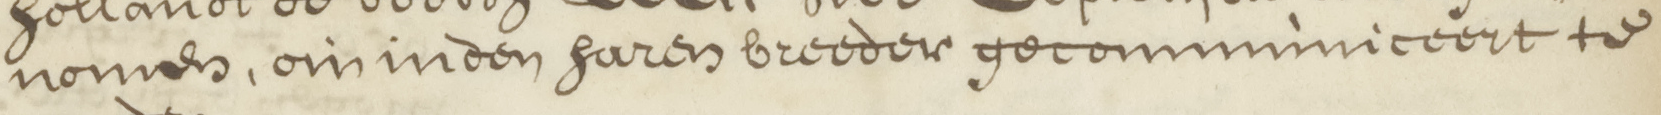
nomen, om inden haren breeder gecommuniceert te
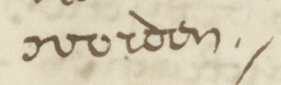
worden.
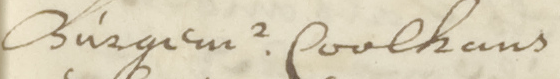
Burgemr. Coolhans
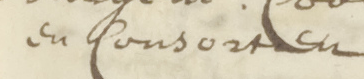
en Consorten
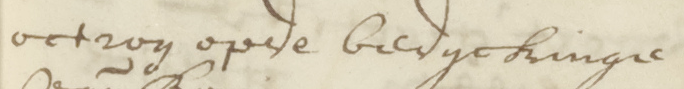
octroy opde bedyckinge
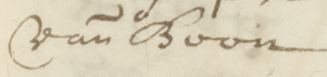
van Boon
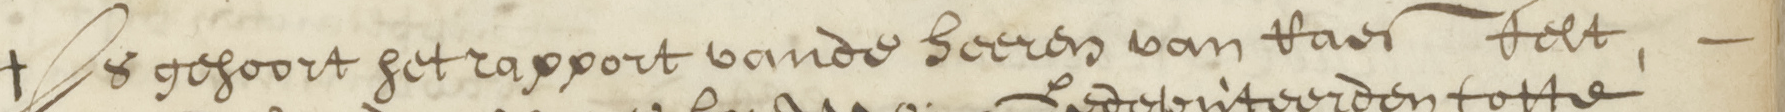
Is gehoort het rapport vande heeren van Raesfelt, —
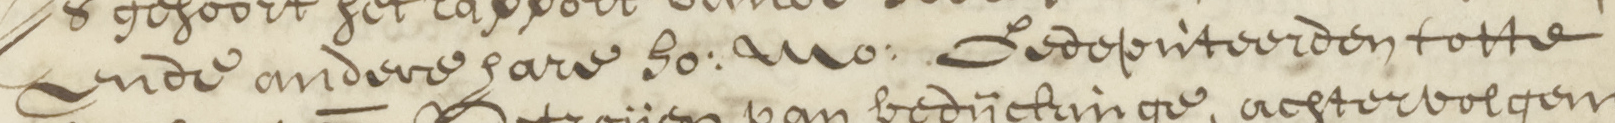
ende andere hare ho:Mo: Gedeputeerden totte
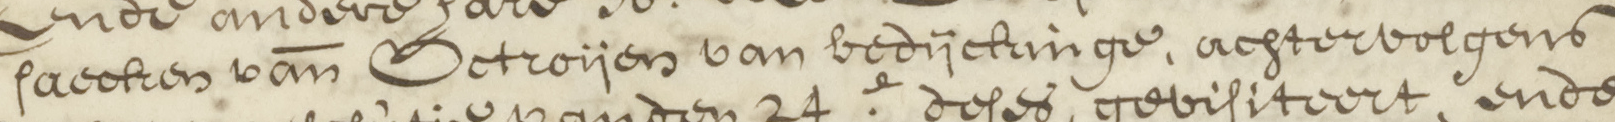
saecken van Octroijen van bedijckinge, achtervolgens
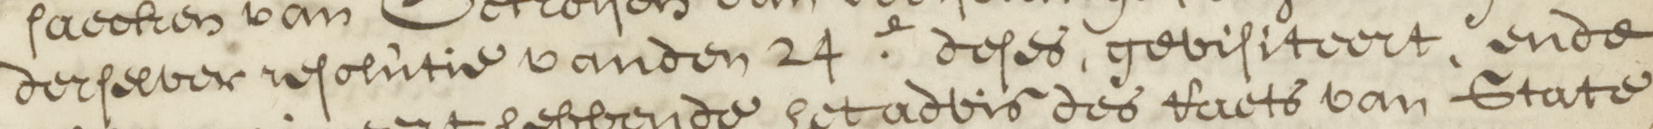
derselver resolutie vanden 24 .e deses, gevisiteert, ende
